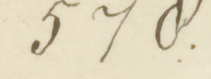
578
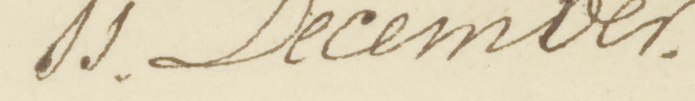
11. December.
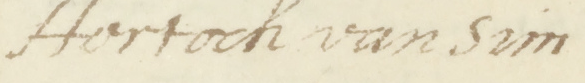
Hertoch van Sim
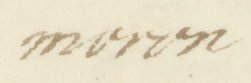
meren
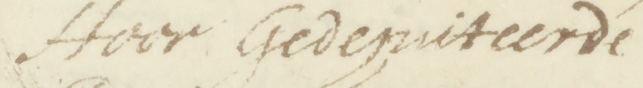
Heer Gedeputeerde
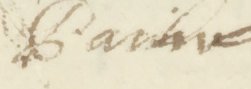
Staten
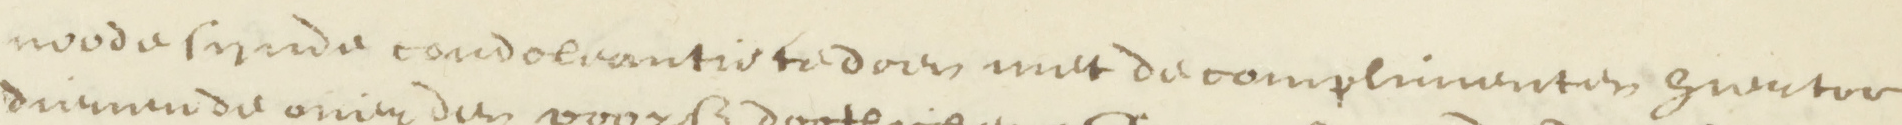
noode synde condoleantie te doen met de complimenten hiertoe
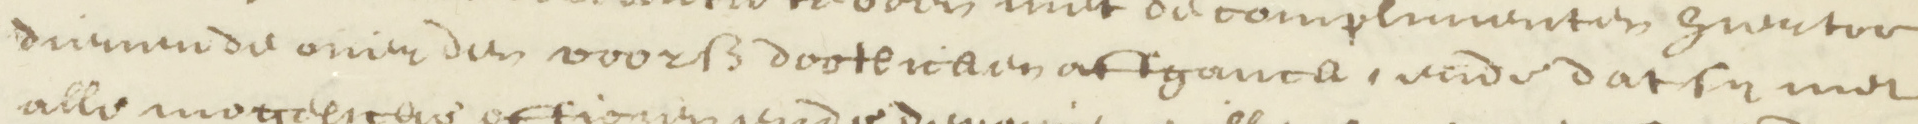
dienende ouer den voors dootlicken affganck, ende dat sy met
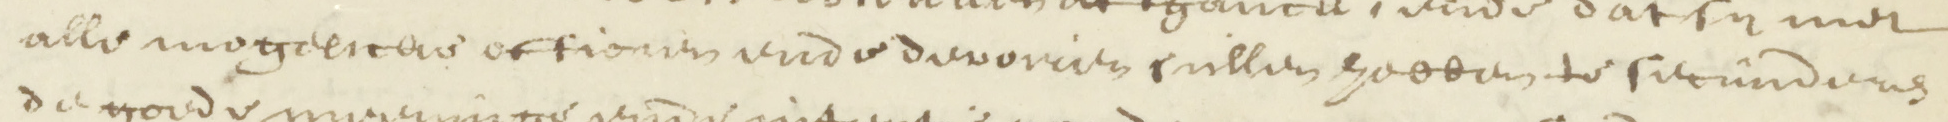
alle mogelicke officien ende devoiren sullen hebben te secunderen
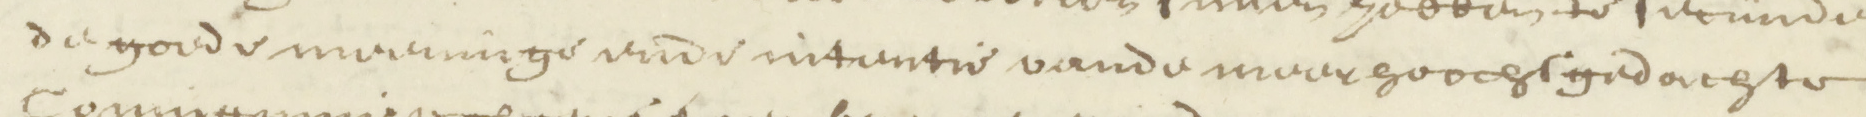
de goede meeninge ende intentie vande meer hoochsgedachte
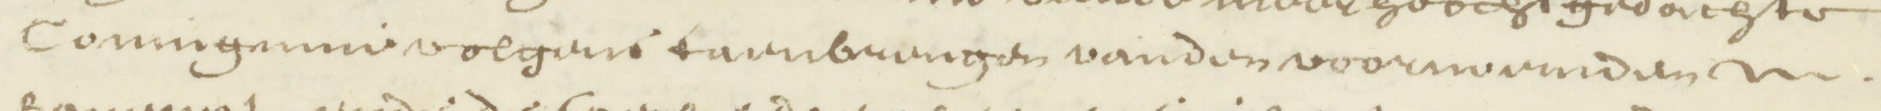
Coninginne volgens t' aenbrengen vanden voornoemden M.
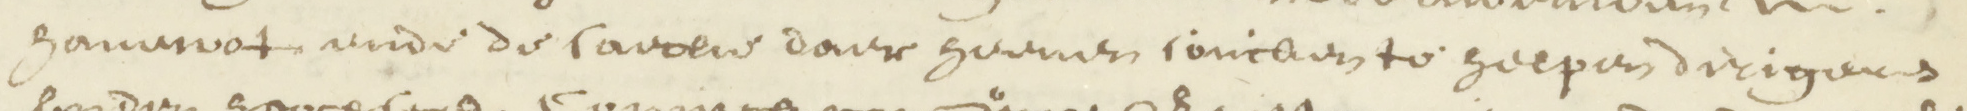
hanewot, ende de saecke daer heenen soucken te helpen dirigeren
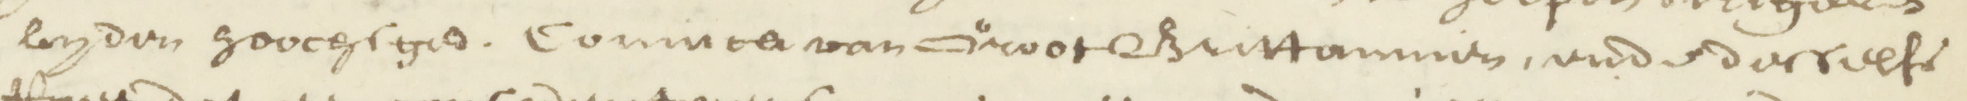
by den hoochsged. Coninck van Groot Brittannien, ende desselfs
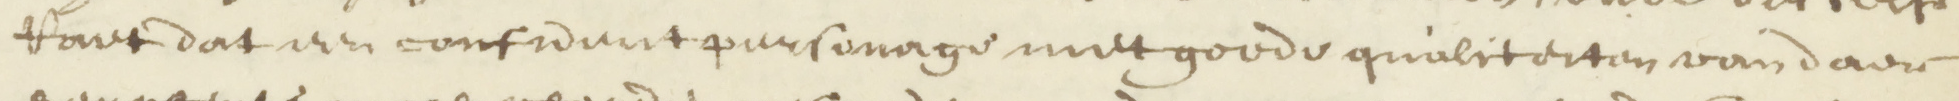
Raet dat een confident personage met goede qualiteiten van daer
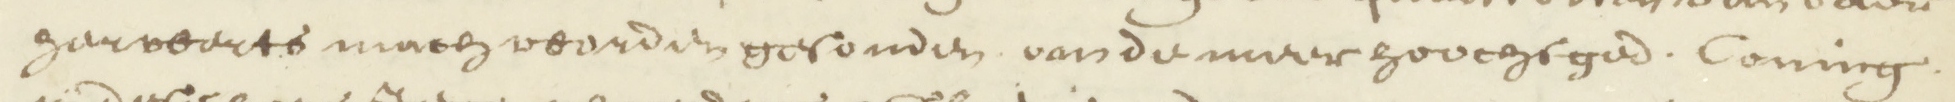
herwerts mach worden gesonden van de meer hoochsged. Coning
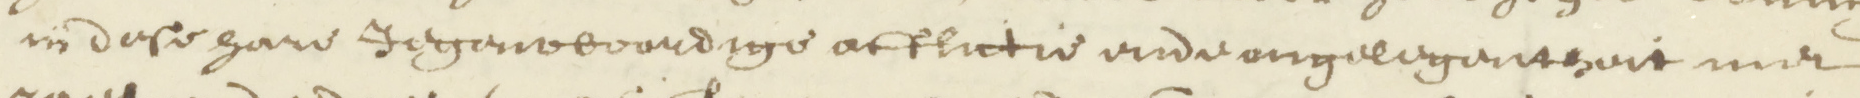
in dese hare Jegenwoordige afflictie ende ongelegentheit met
